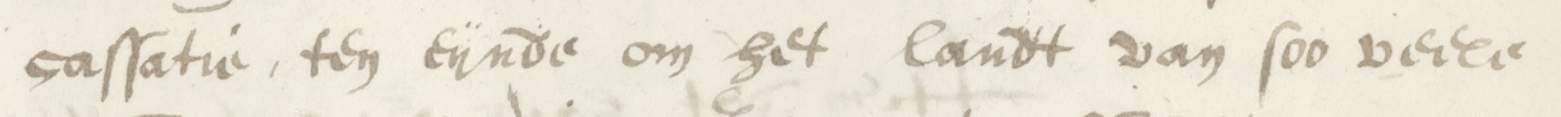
cassatie, ten eijnde om het landt van soo veele
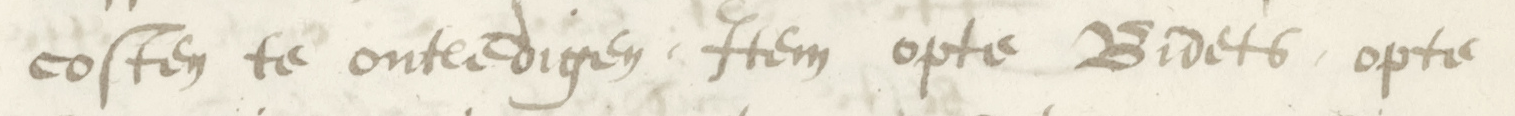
costen te ontledigen. Item opte Bidets, opte
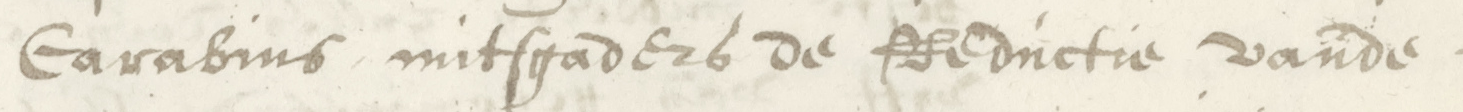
Carabins, mitsgaders de reductie vande
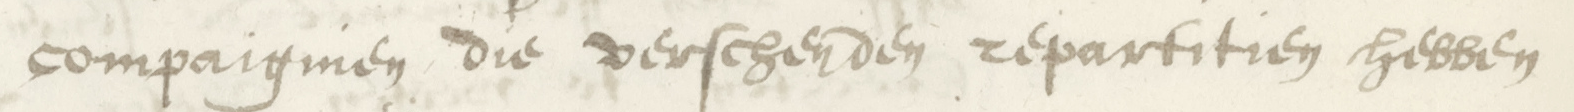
compaignien, die verscheyden repartitien hebben
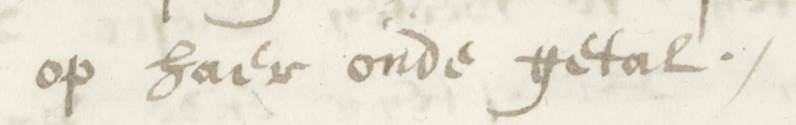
op haer oude getal.
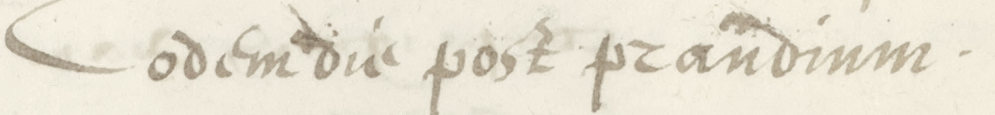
Eodem die post prandium.
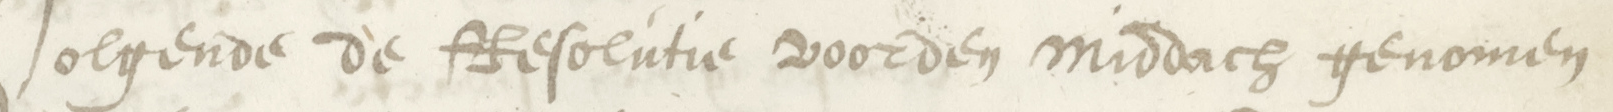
Volgende der Resolutie voorden middach genomen
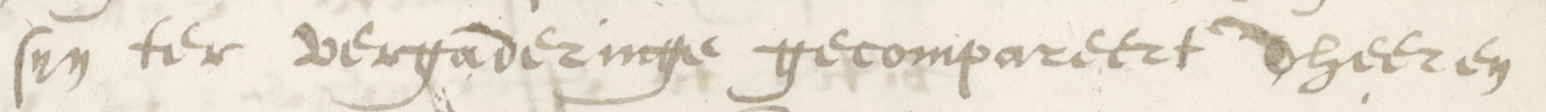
syn ter vergaderinge gecompareert dheeren
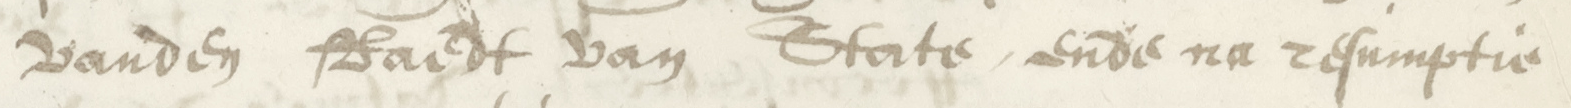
vanden Raedt van State, ende na resumptie
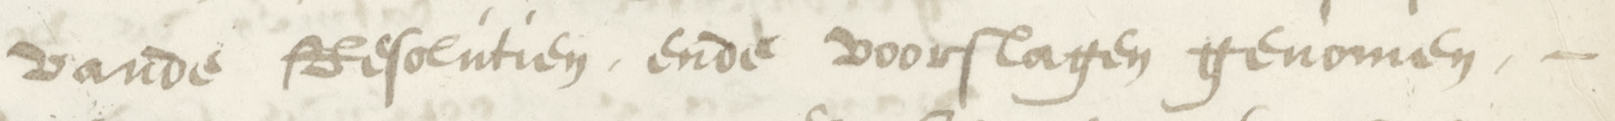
vande Resolutien, ende voorslagen genomen,
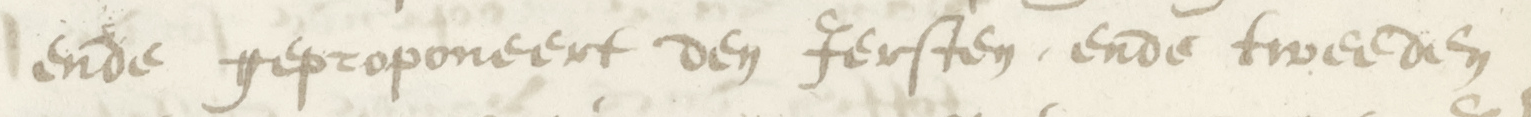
ende geproponeert den Iersten, ende tweeden
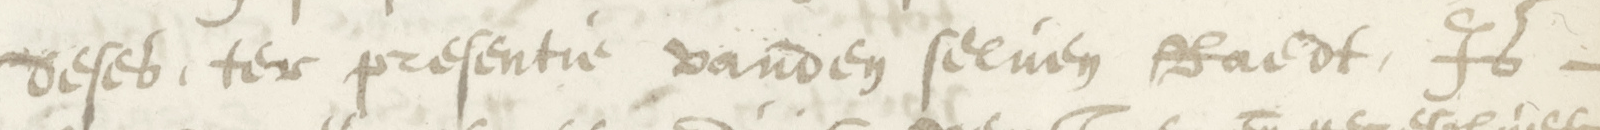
deses, ter presentie vanden seluen Raedt, Is
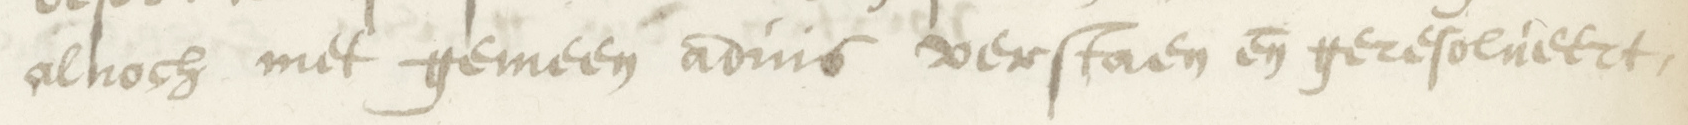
alnoch met gemeen aduis verstaen end geresolueert
